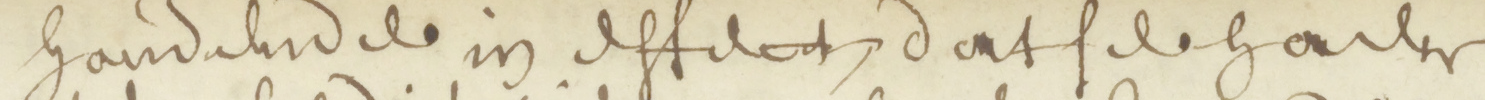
houdende in effect, dat se haer
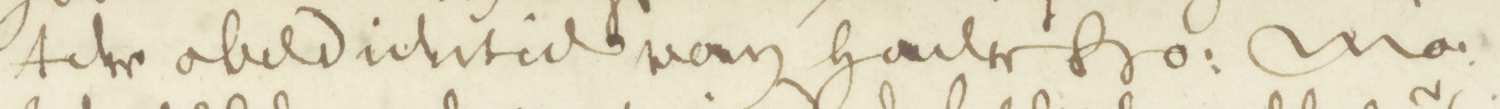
ter obedientie van haer Ho:Mo:
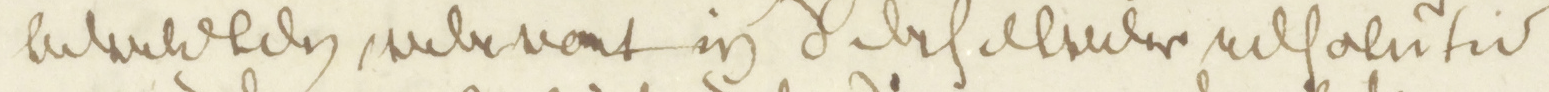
beveelen, vervat in derselver resolutie
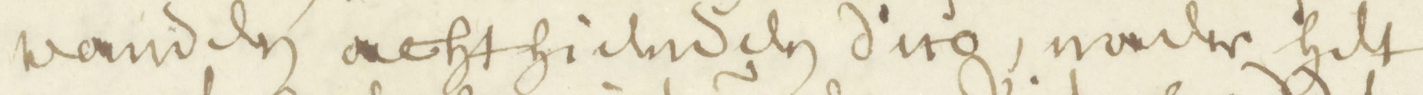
vanden achthienden dito, naer het
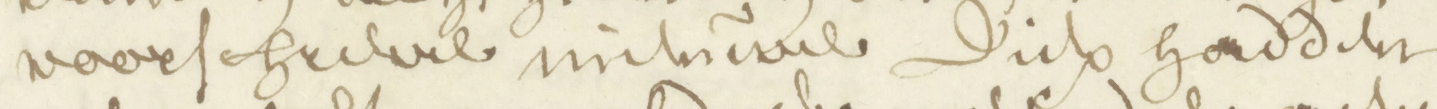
voorschreve nieuwe Diep hadden
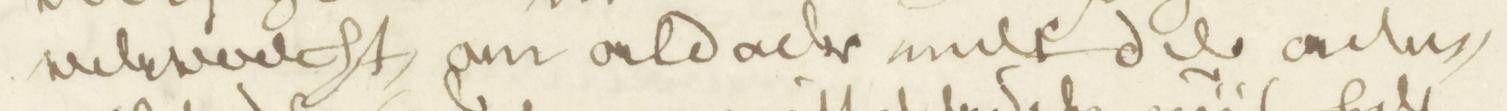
vervoecht, om aldaer met de aen„
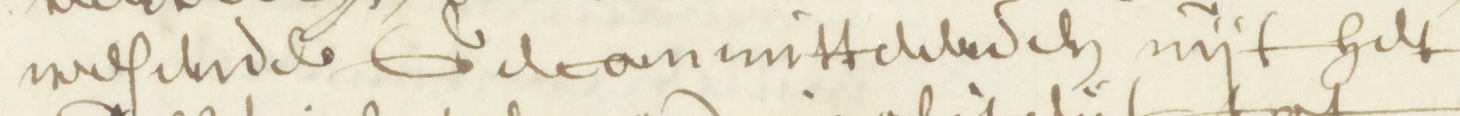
wesende Gecommitteerden uijt het
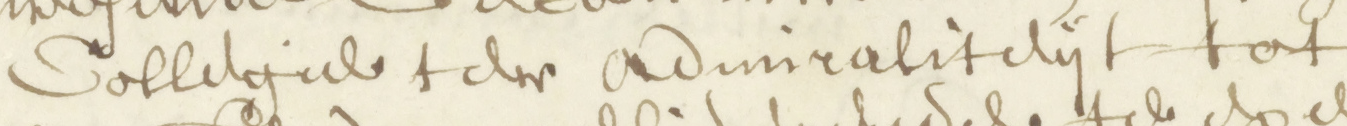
Collegie ter Admiraliteijt tot
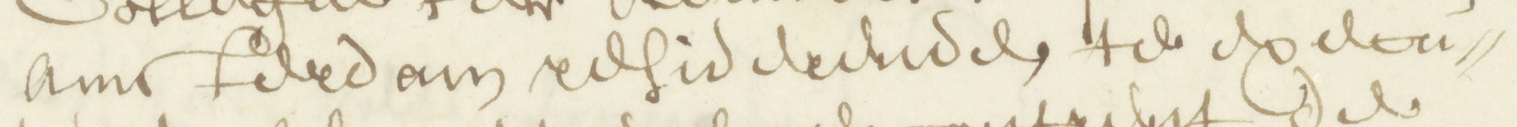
Amsterdam residerenden te execu,,
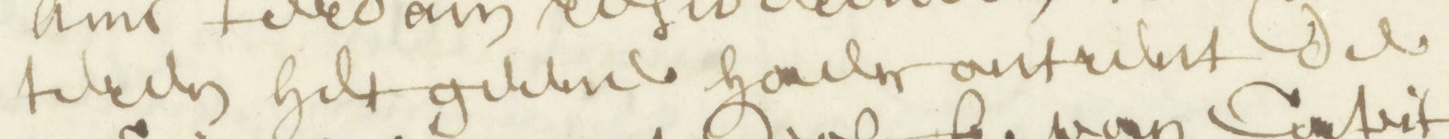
teren het geene haer ontrent de
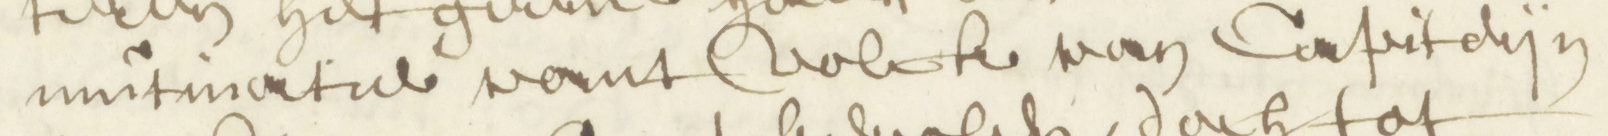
mutinatie vant volck van Capiteijn
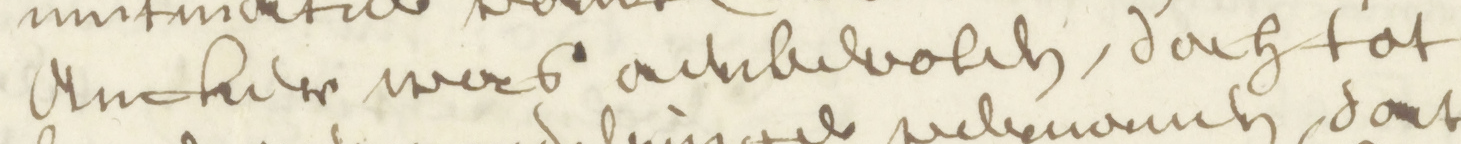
Ancker was aenbevolen, doch tot
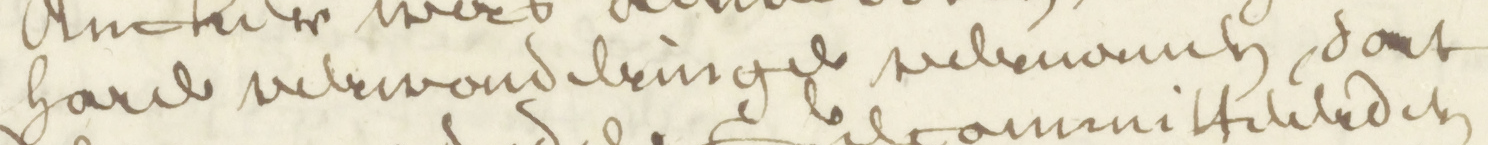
hare verwonderinge vernomen, dat
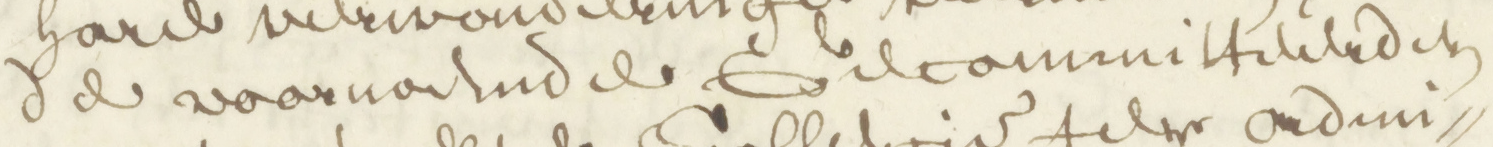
de voornoemde Gecommitteerden
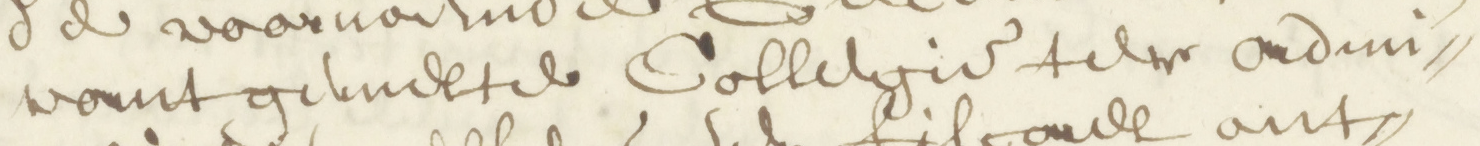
vant gemelte Collegie ter admi,,
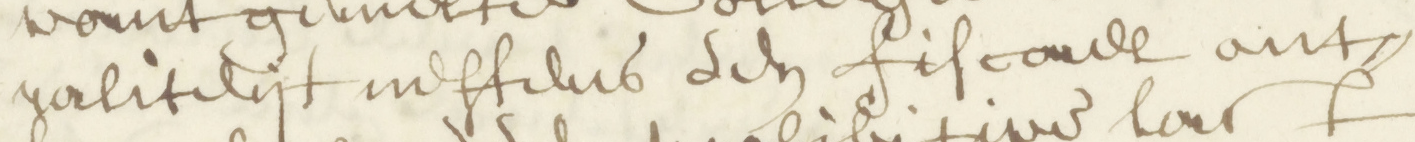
raliteijt neffens den fiscael ont„
